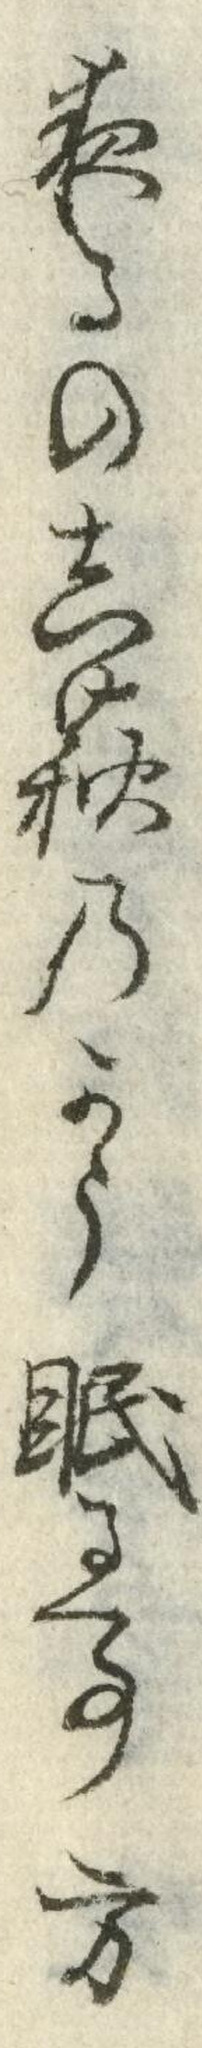夜るの真萩のかう眠る事方
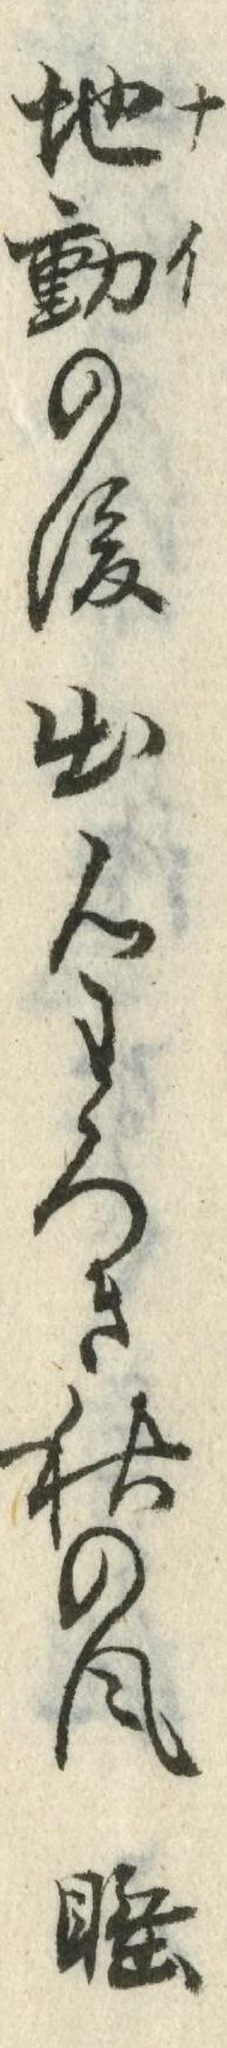地道の後出心わろく秋の風睡
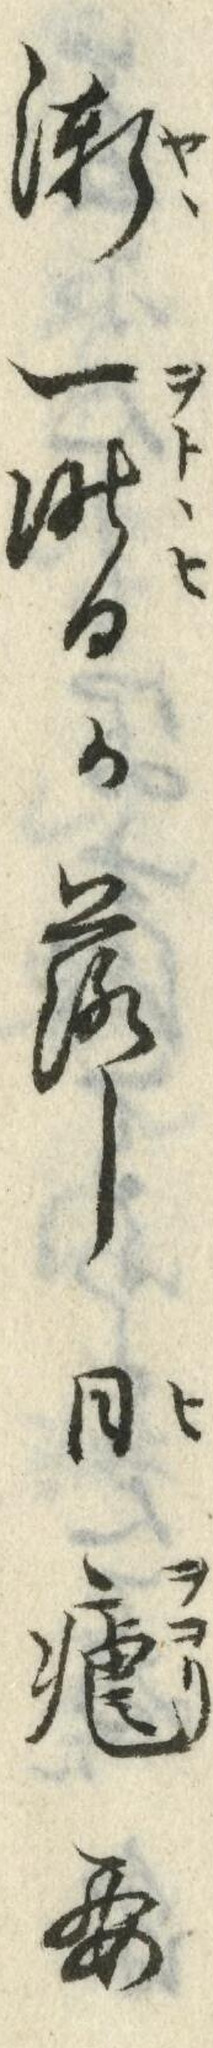漸一昨日か落し日瘧要
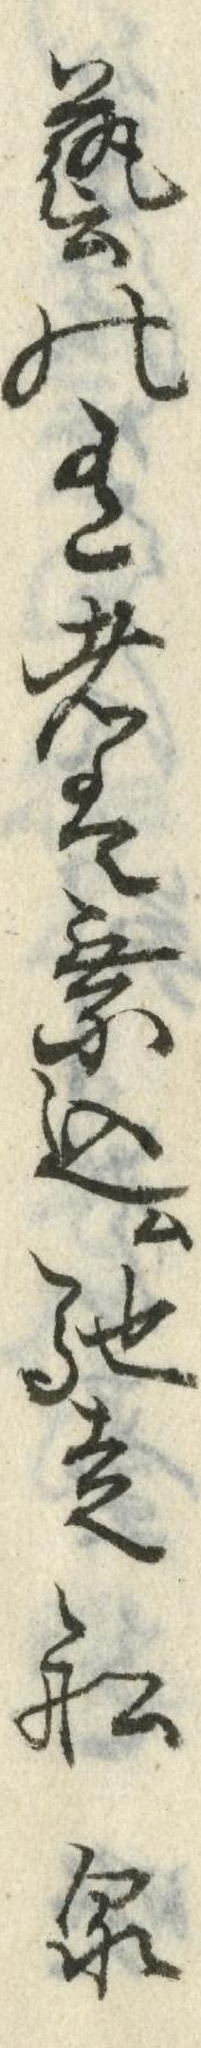芸の有者は乗込ム馳走船泉
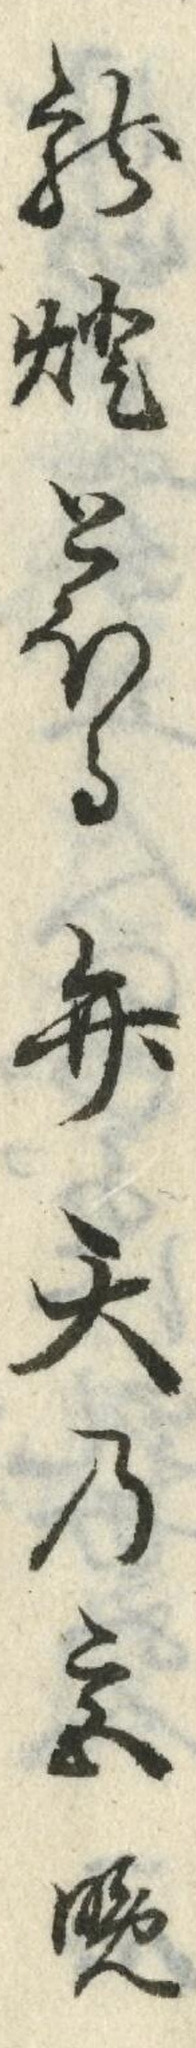龍灯とほる弁天の宮晩
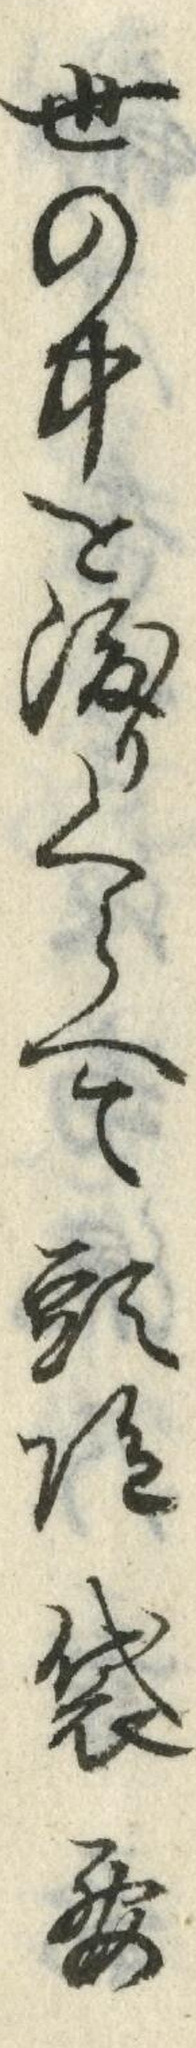世の中を渡りくらへて頭陀袋要
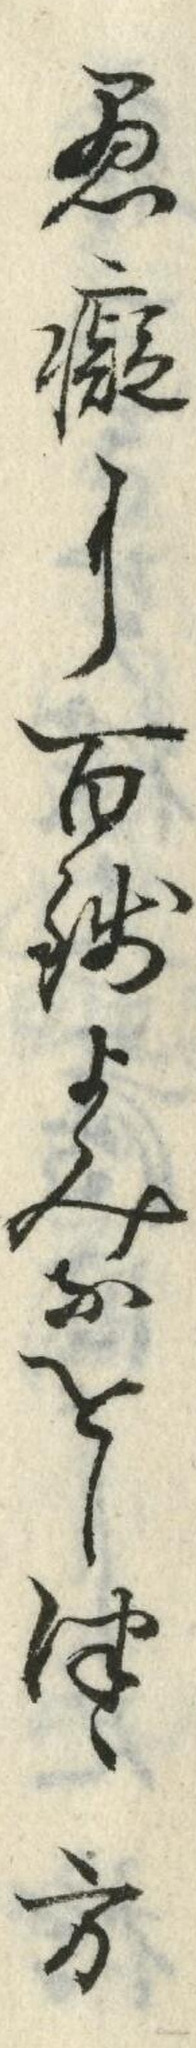愚癡に百銭よみなほしつゝ方
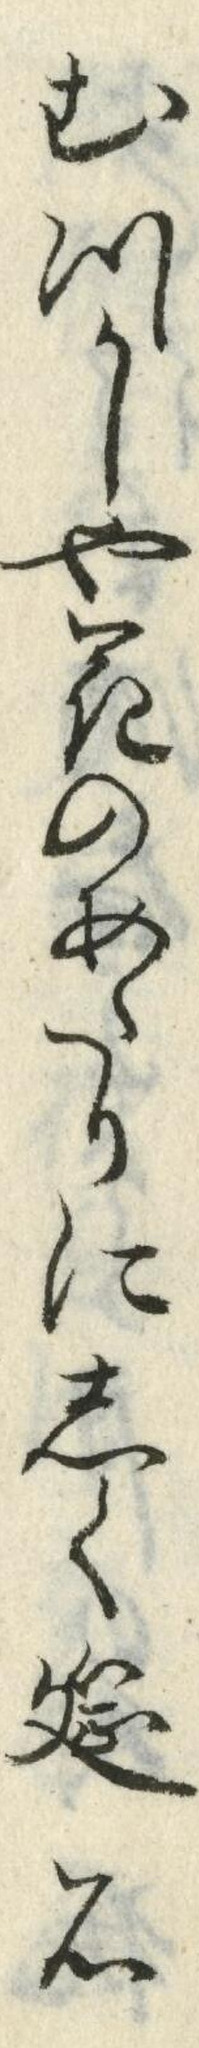むつかしや花のあたりにしく莚石
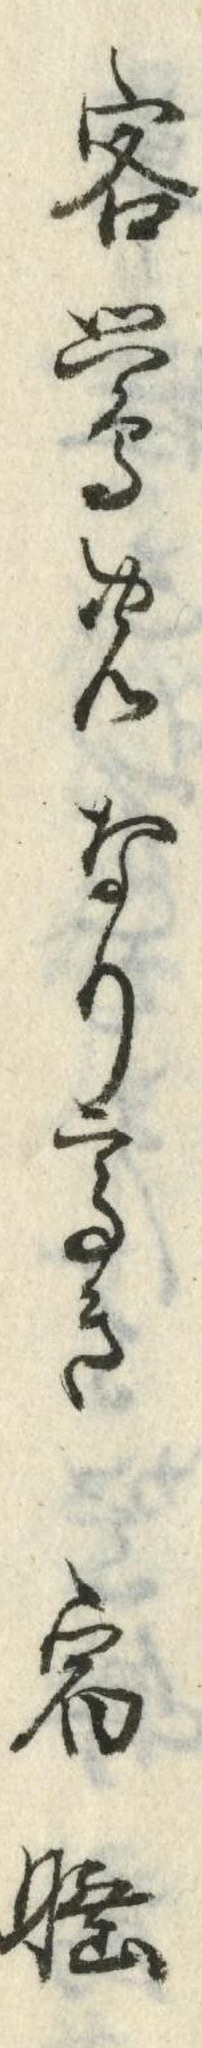客鴬のなり高き宿睡

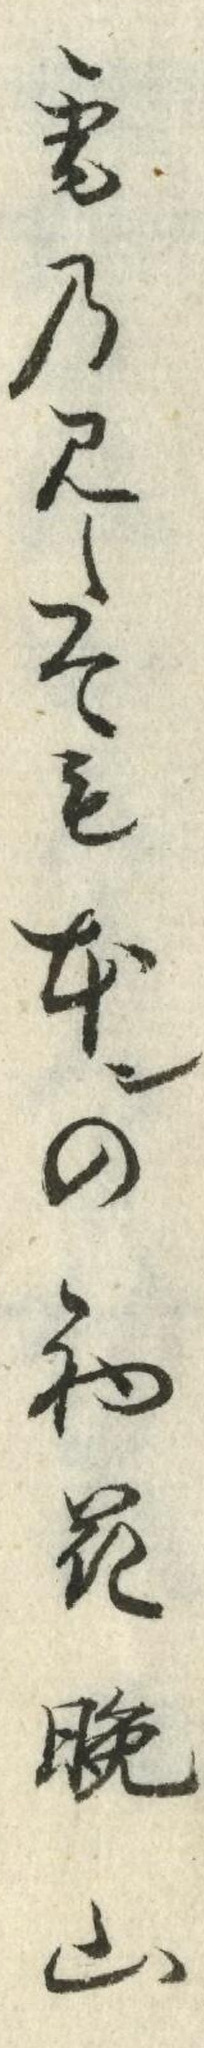電の見たても本ンの初花晩山
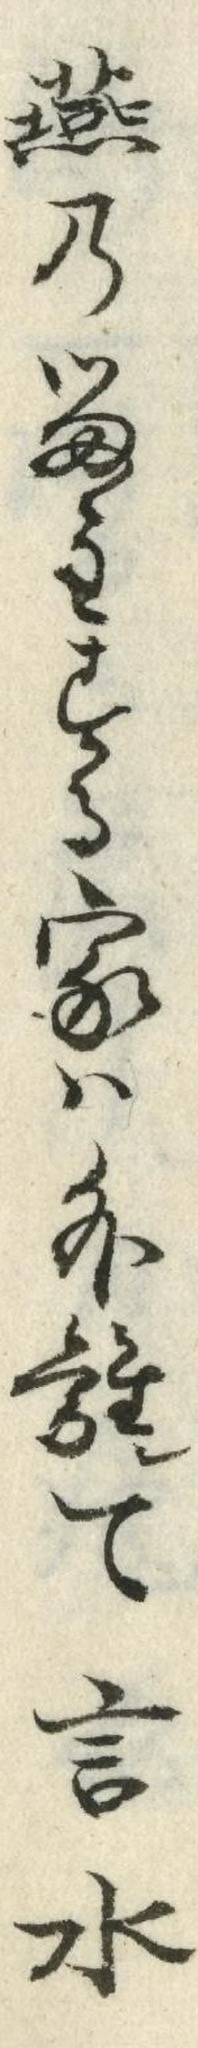燕の留守する家ハ外離レて言水
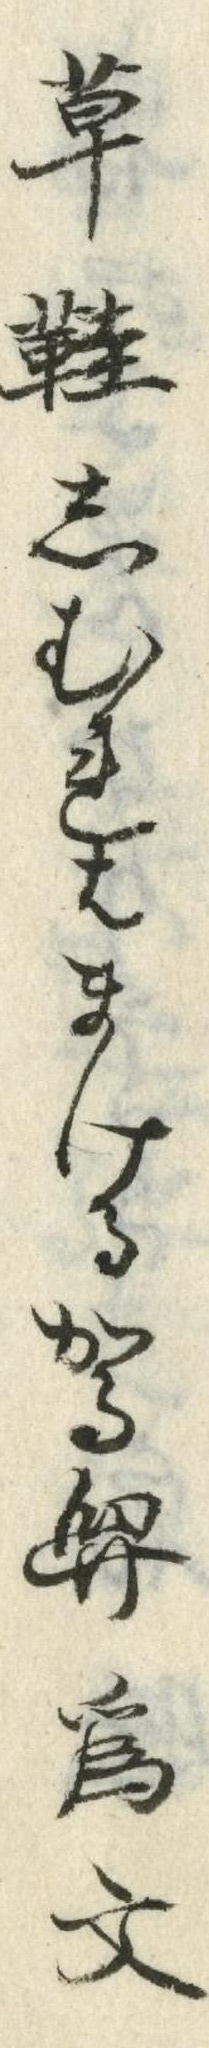草鞋しむれはまける駕舁為文
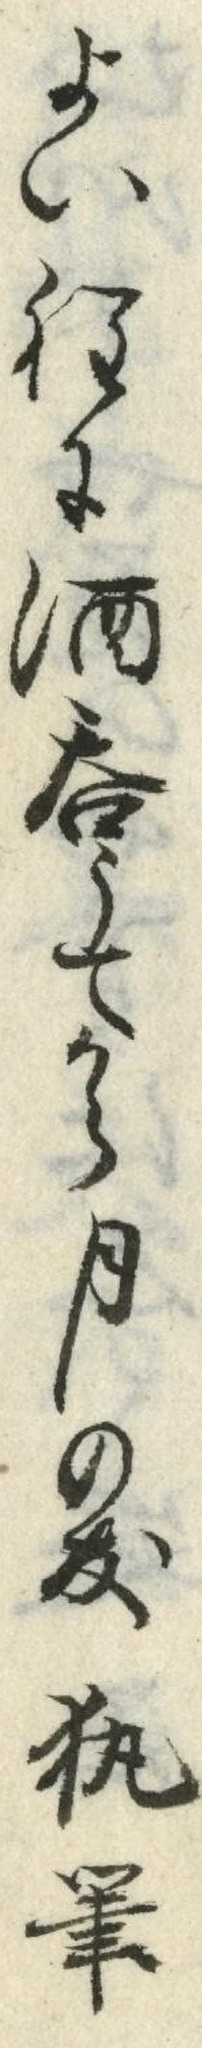よい程に酒呑うてから月の友執筆
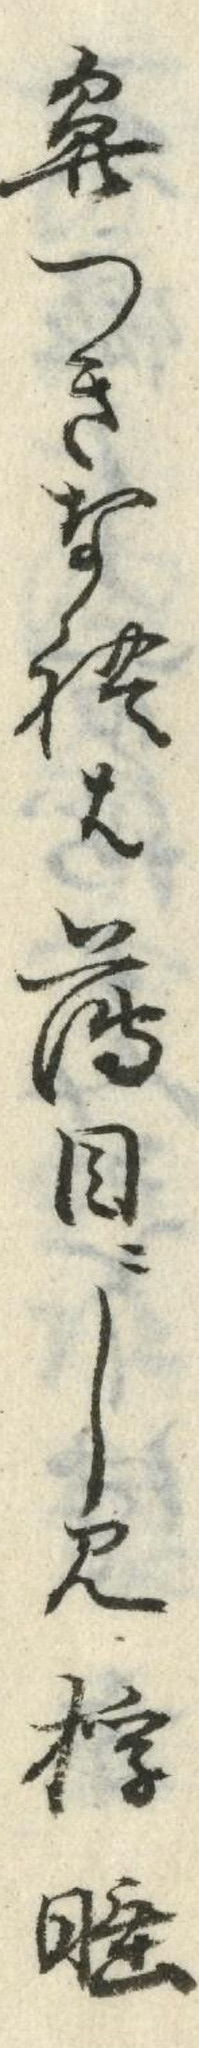鼻つきなれは薄目ニし見桴睡
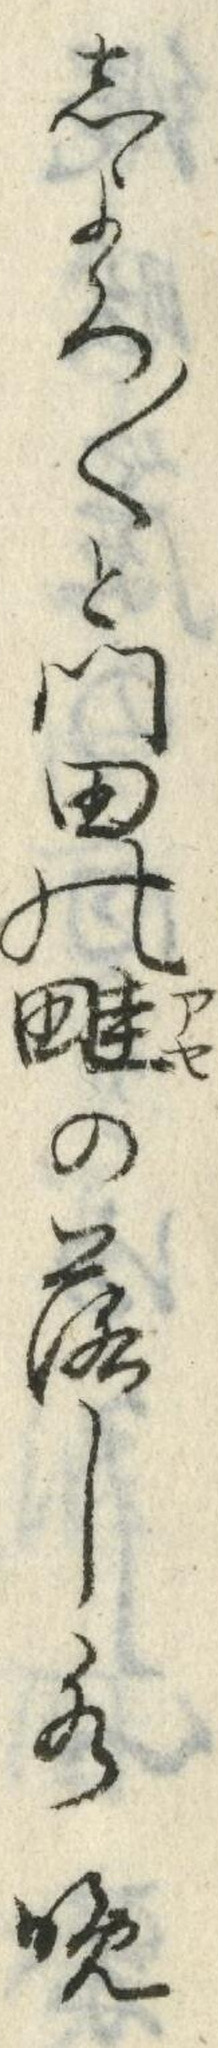しよろ〳〵と門田の畦の落し水晩
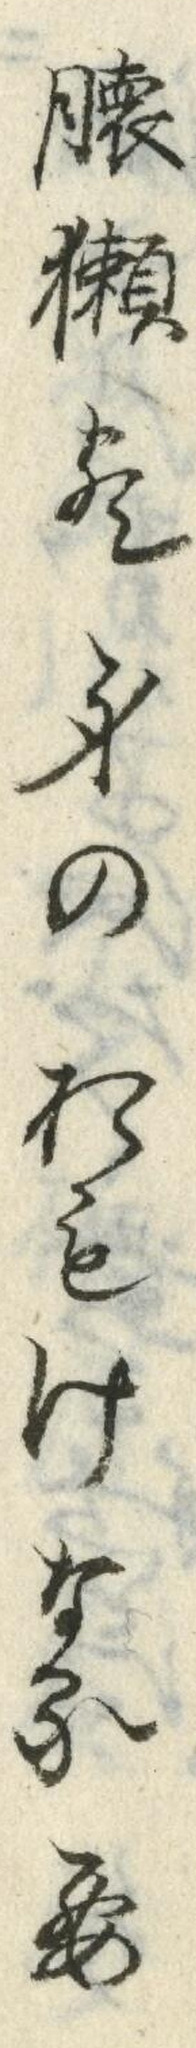懐獺歟身のおもけなる要
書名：誹諧　能登釜
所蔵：Ishikawa Prefectural Library
